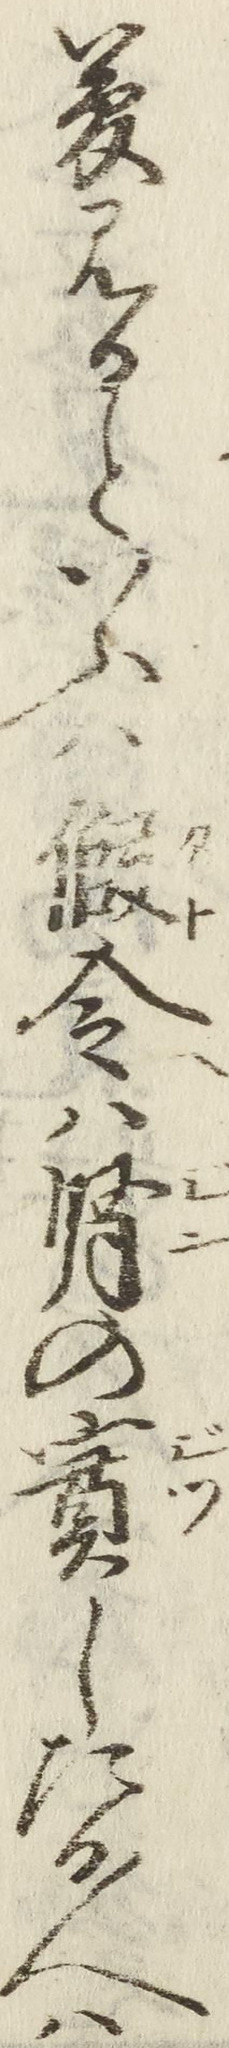夢見るといふは縦令は腎の実したる人は
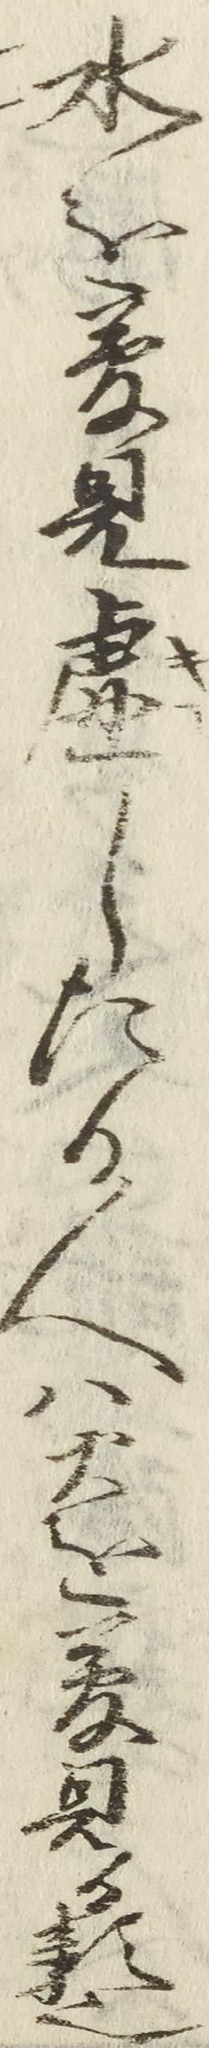水を夢見虚したる人は火を夢見る類也

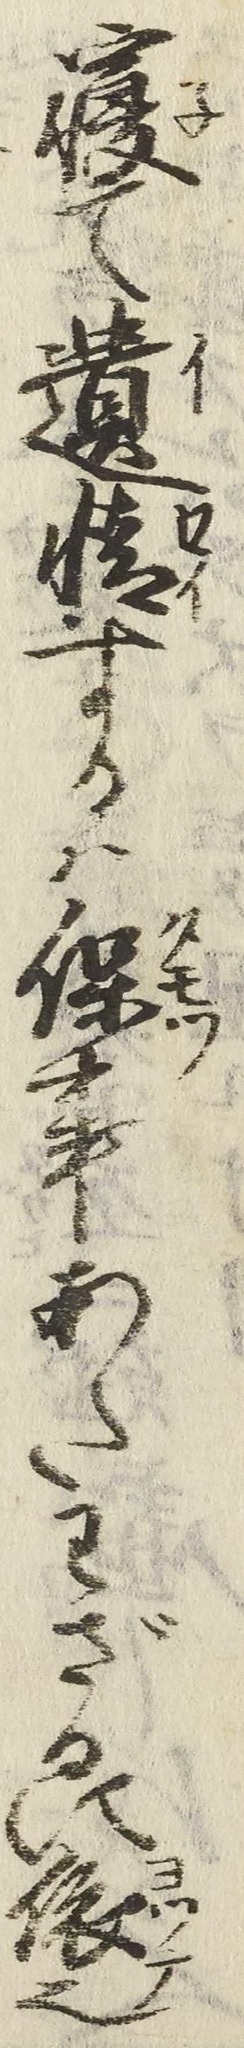寝て遺情するは保事あたわざるに依也
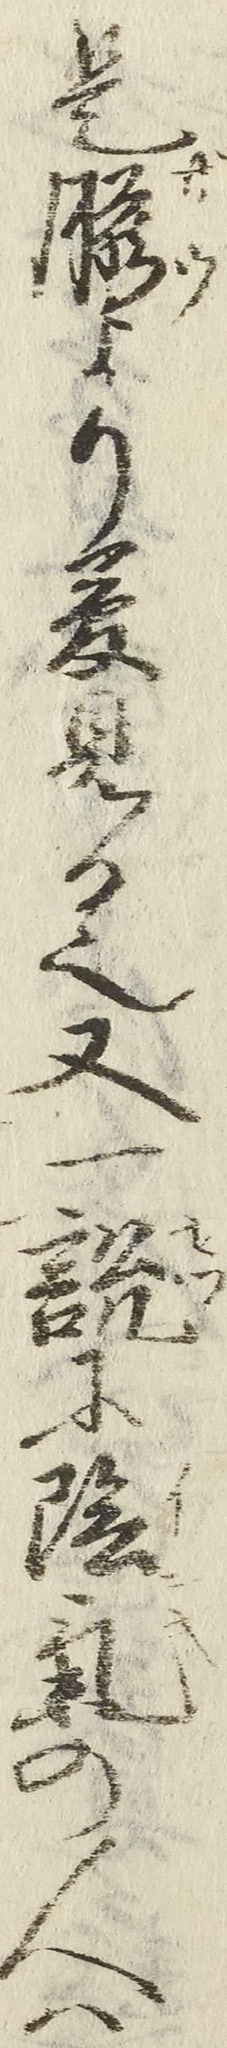是臓より夢見る也又一説に陰気の人は
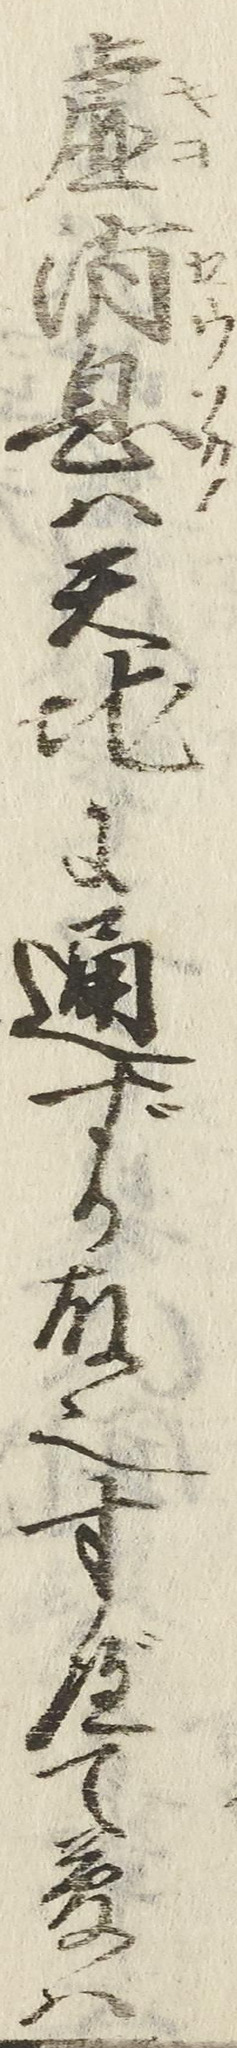虚消息は天地に通ずる故也すべて夢は
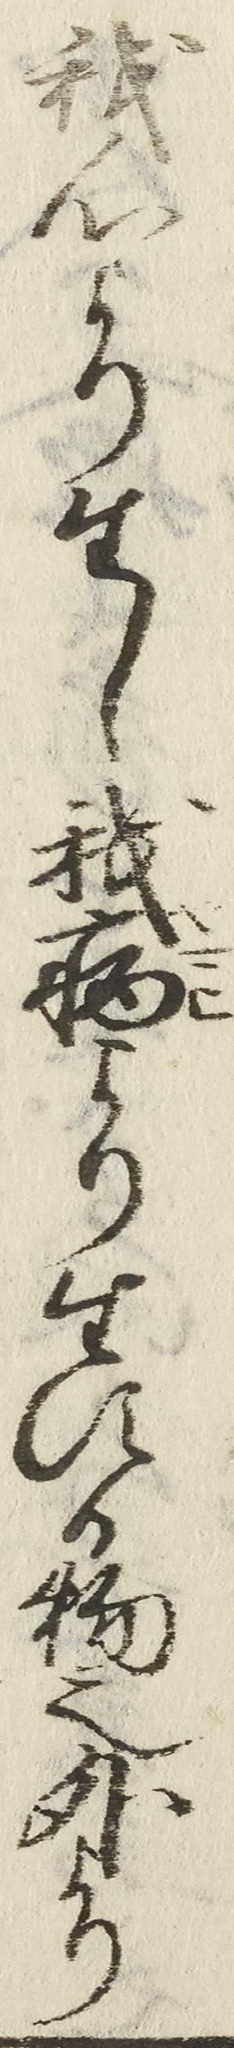我心より生し我病より生する物也外より
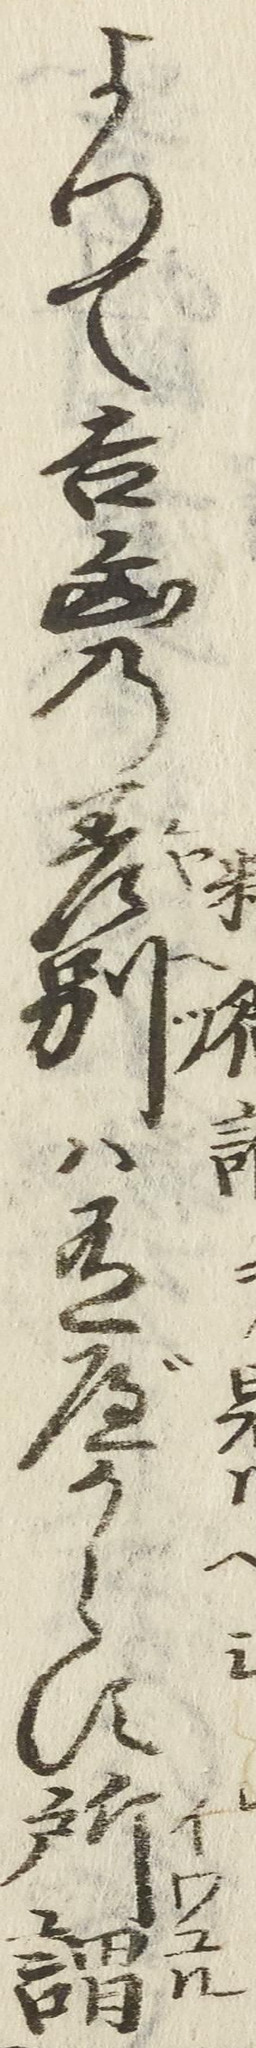よつて吉凶の差別は有べからす所謂
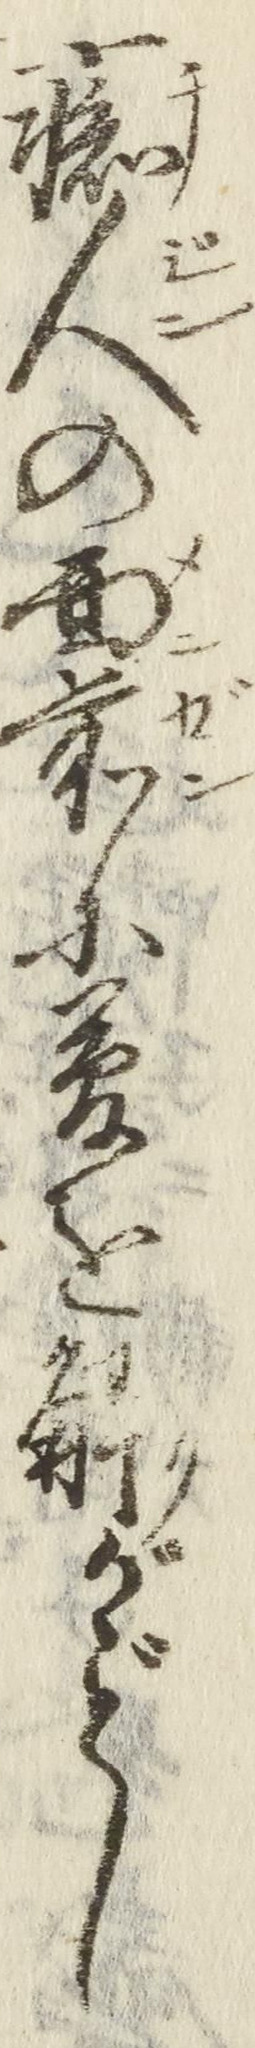痴人の面前に夢を解がごとし
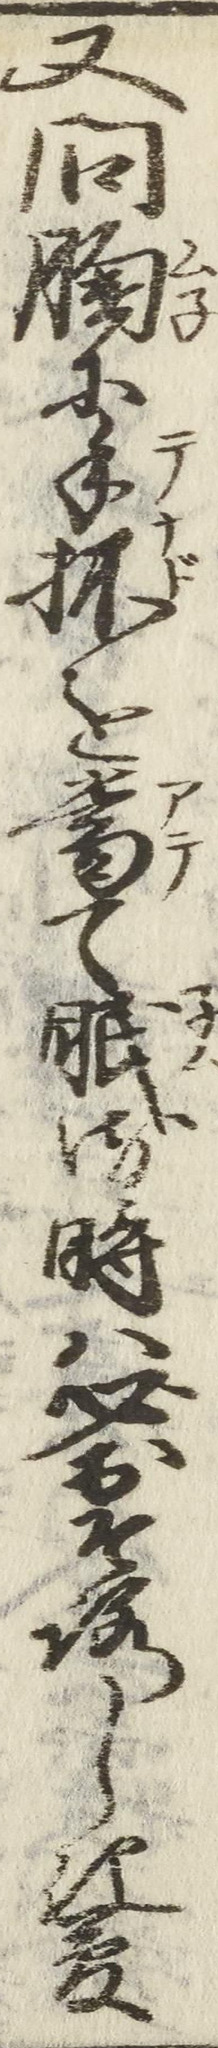又問胸に手抔を当て眠る時は必おそろしき夢
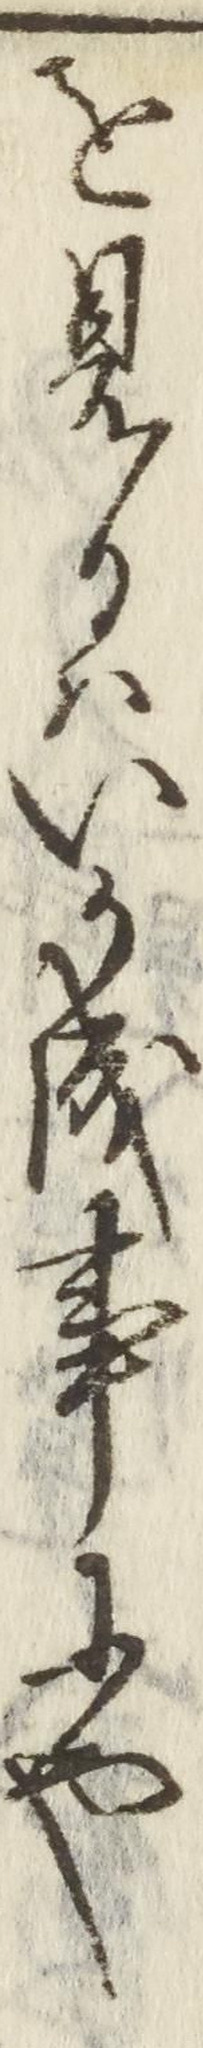を見るはいか成事にや
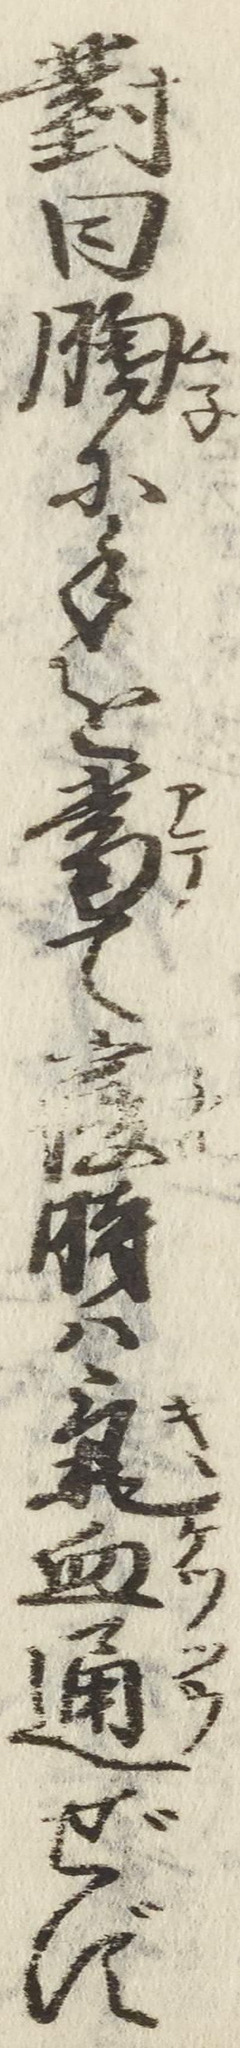対曰胸に手を当て寝時は気血通ぜず
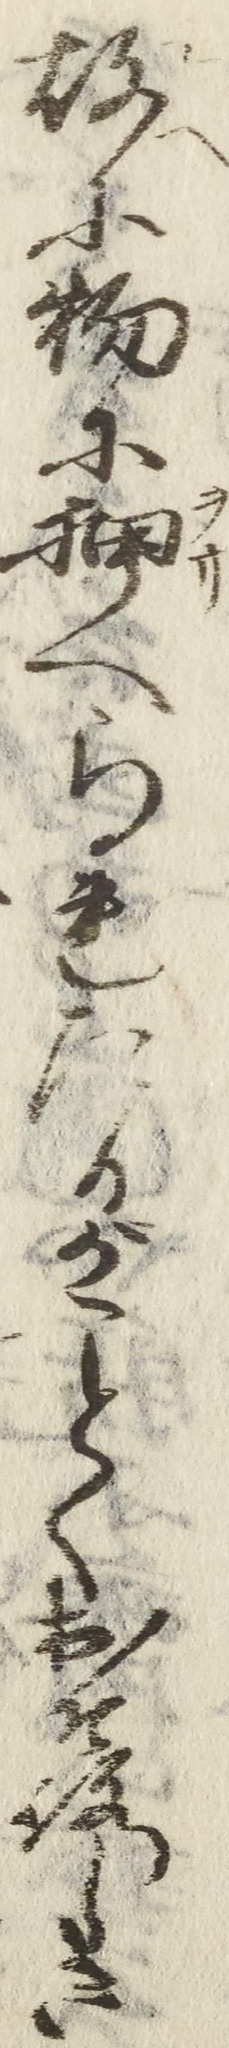故に物に押へられたるがことくおそろしき
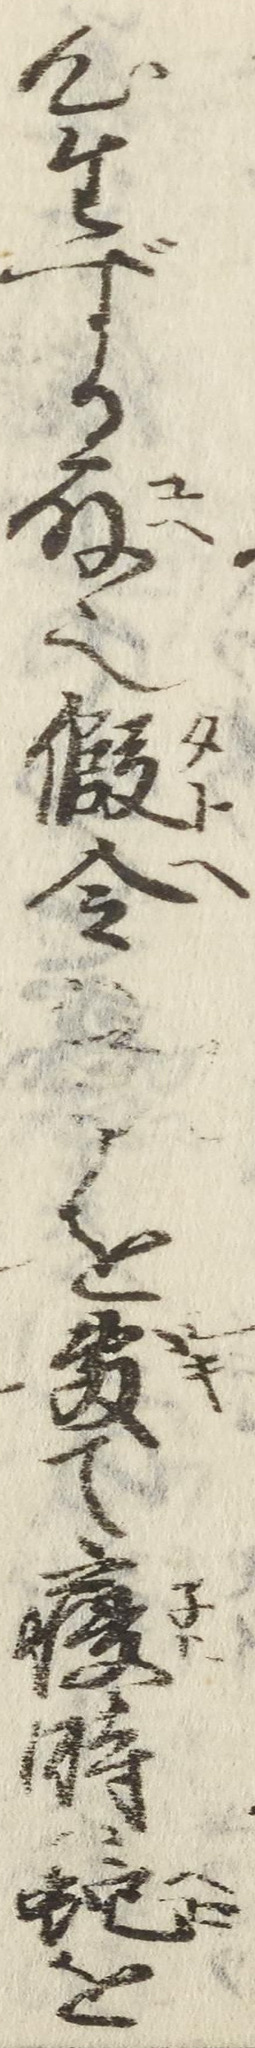心生ずる故也仮令は帯を敷て寝時は蛇を
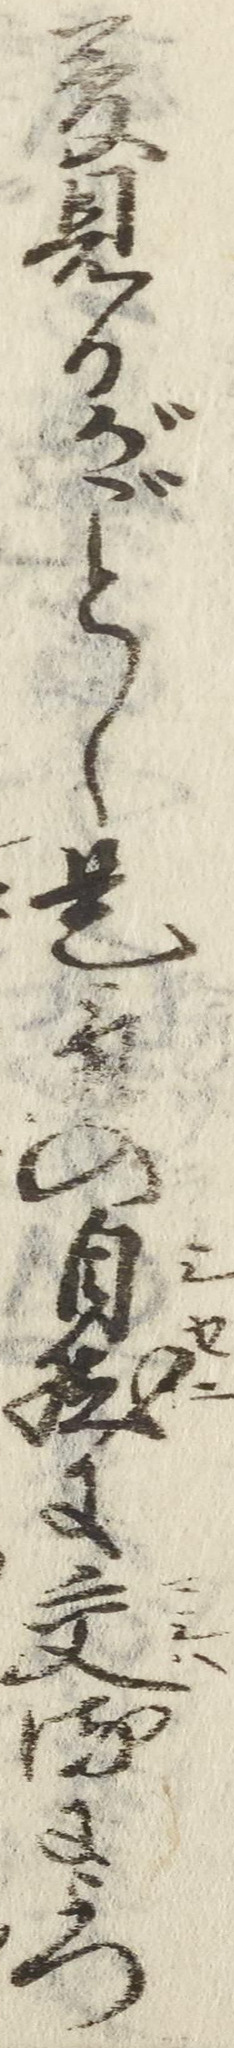夢見るがごとし是気の自然に交るによつ

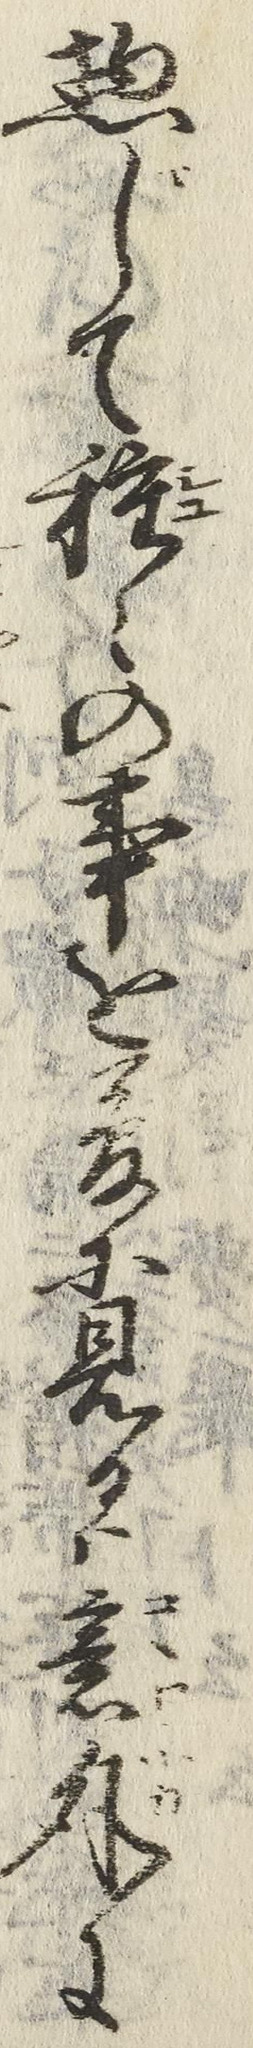惣じて種々の事を夢に見るは意外に
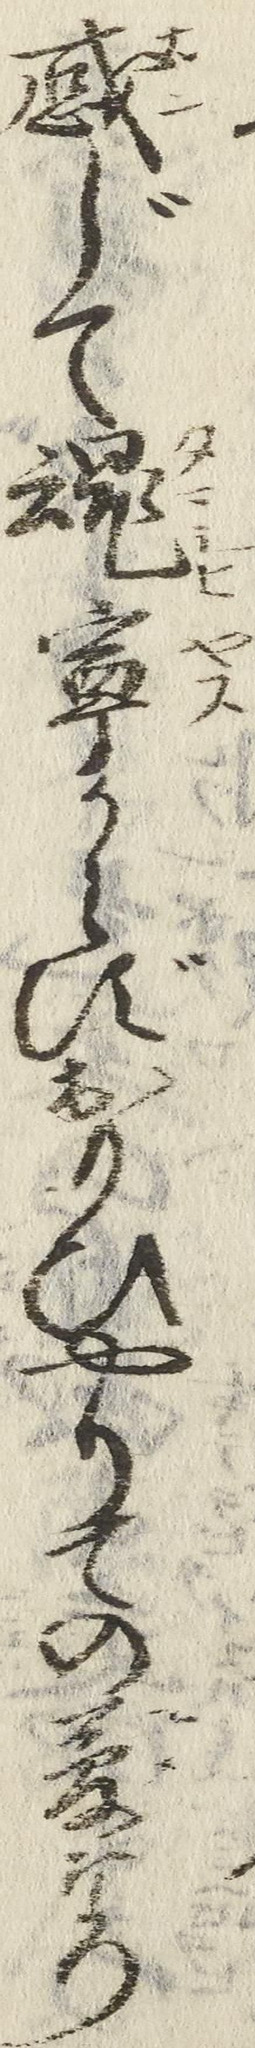感じて魂寧からずおもひやりての夢なり
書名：天地或問珍　地
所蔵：東京大学地震研究所図書室 Earthquake Research Institute Library, The University of Tokyo, JAPAN
